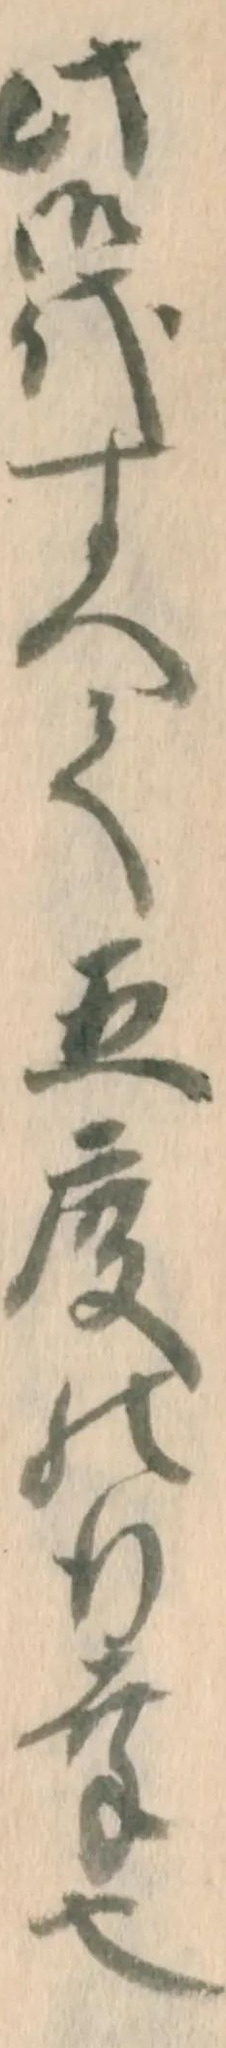此御代すへて五度の行幸也
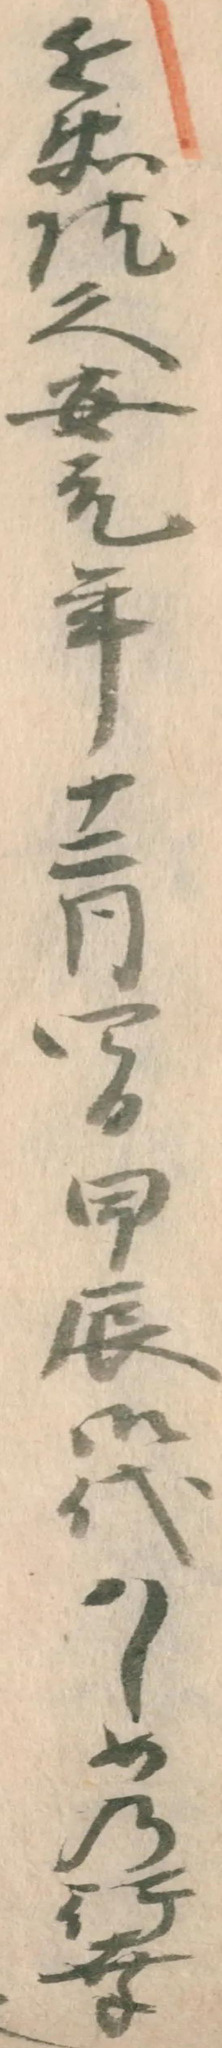近衛院久安元年十二月四日甲辰御代はしめの行幸也
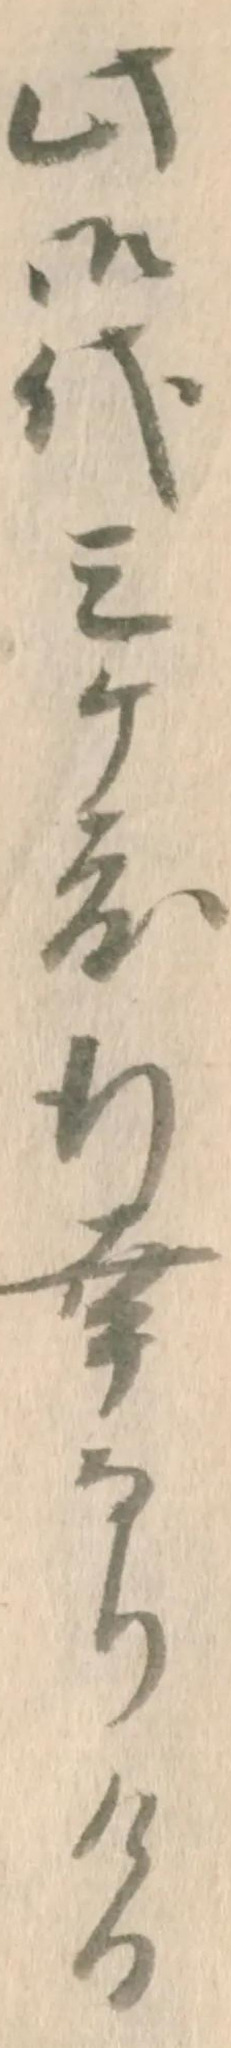此御代三ヶ度行幸なりける
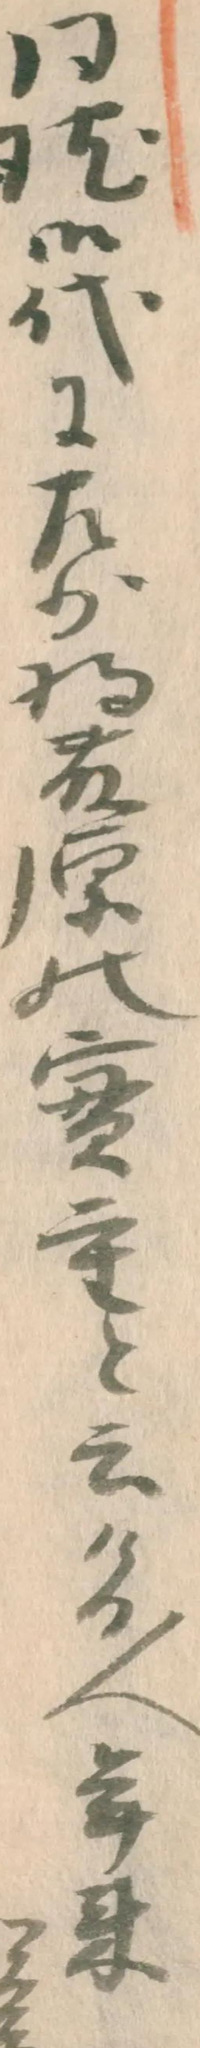同院御代に左少将藤原の実重と云ける人年来賀茂
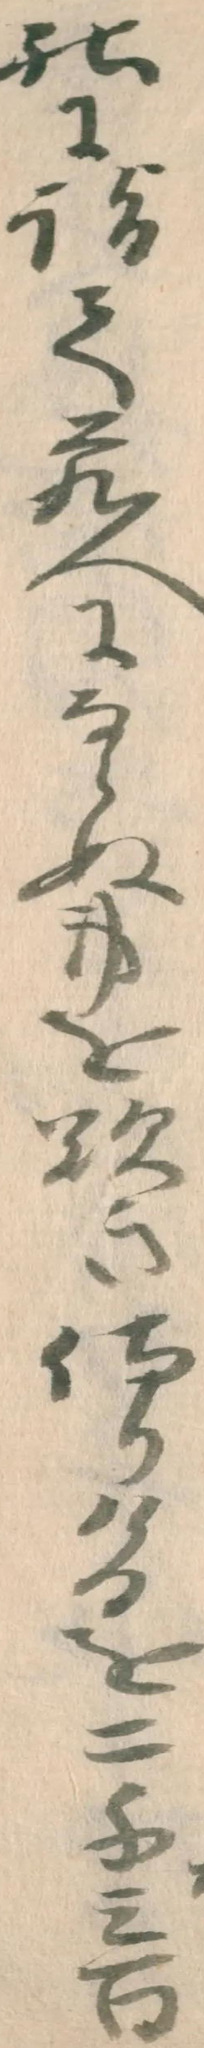社に詣て蔵人にならぬ事を歎き侍りけるを二千三百
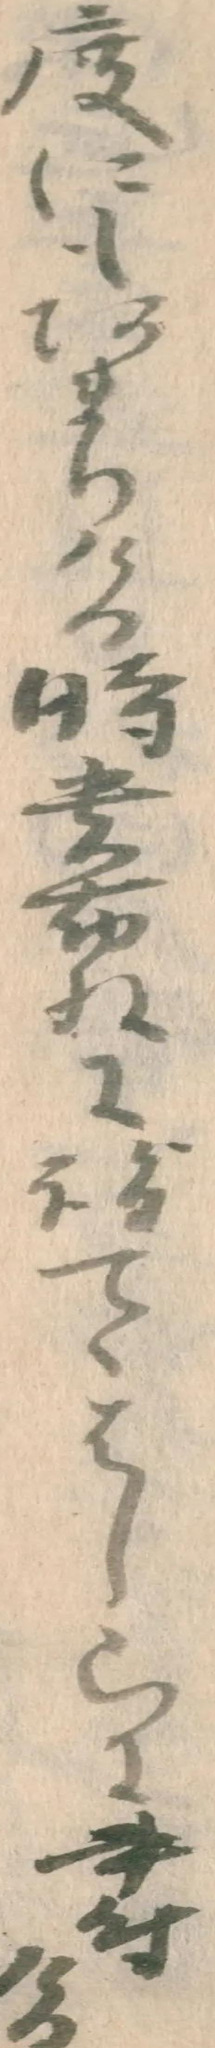度にもあまりける時貴ふねに詣てゝはしらに書付ける
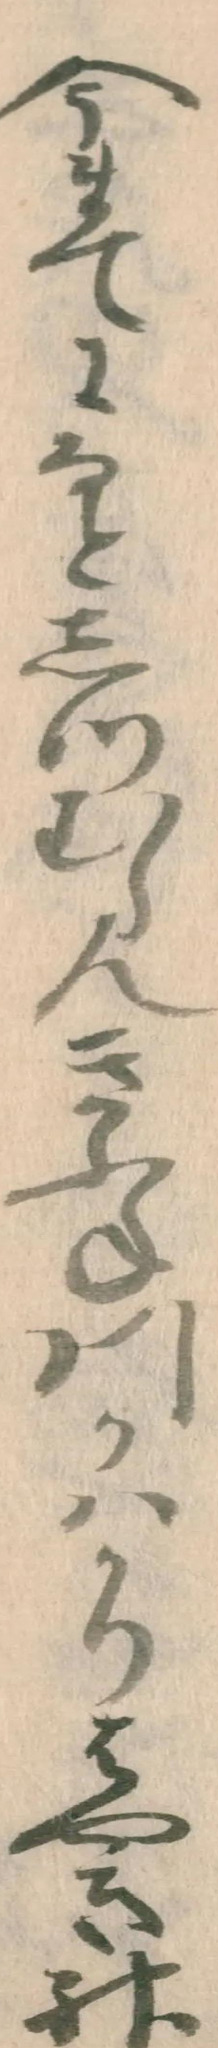今まてになとしつむらんきふね川かはかりはやき神
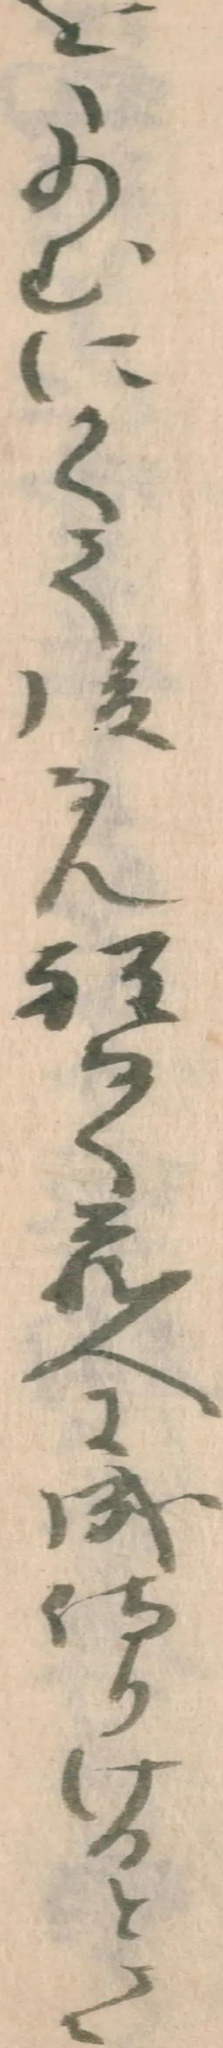をたのむにかくて後なん程なく蔵人に成侍りけると云々
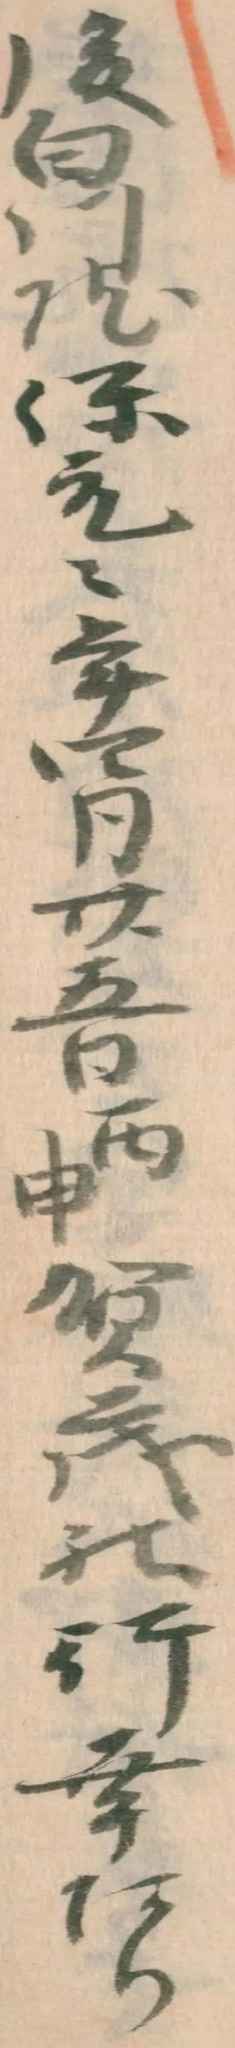後白川院保元々年四月廿五日丙申賀茂社行幸あり
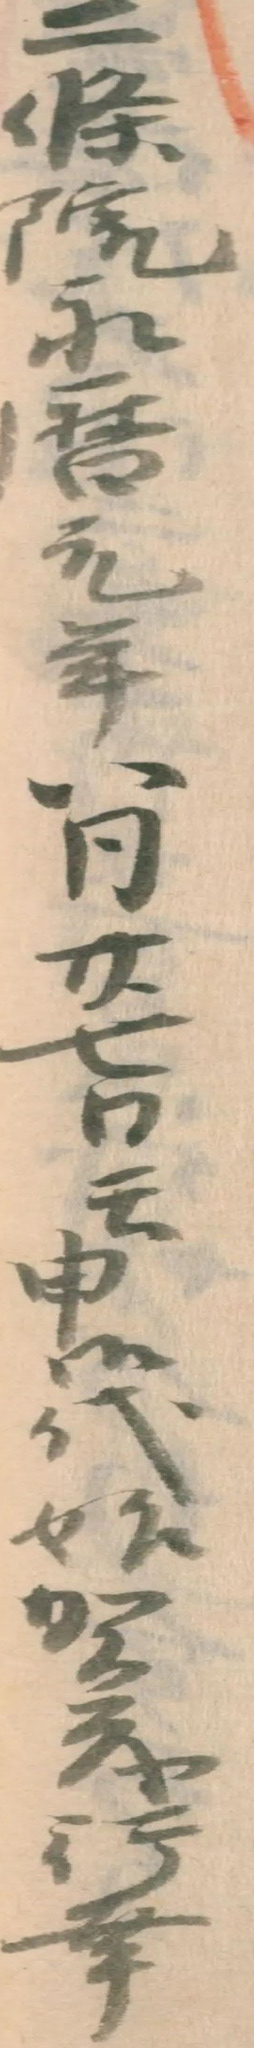二條院永暦元年八月廿七日壬申御代始賀茂行幸
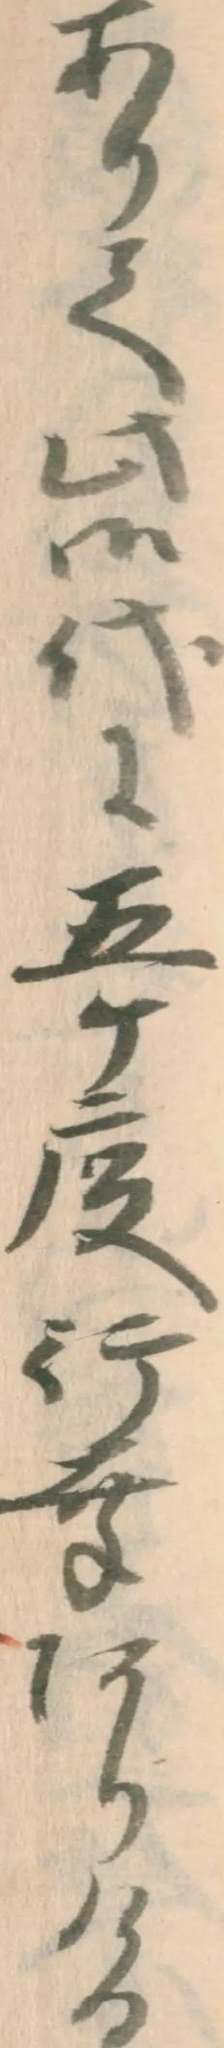ありて此御代に五ヶ度行幸ありける
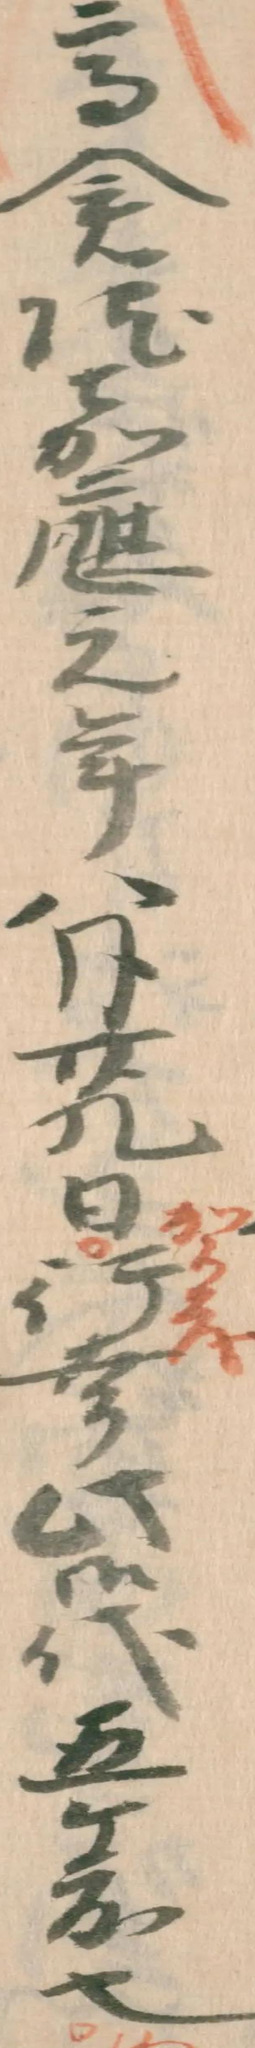高倉院嘉応元年八月廿九日◦行幸此御代五ヶ度也◦
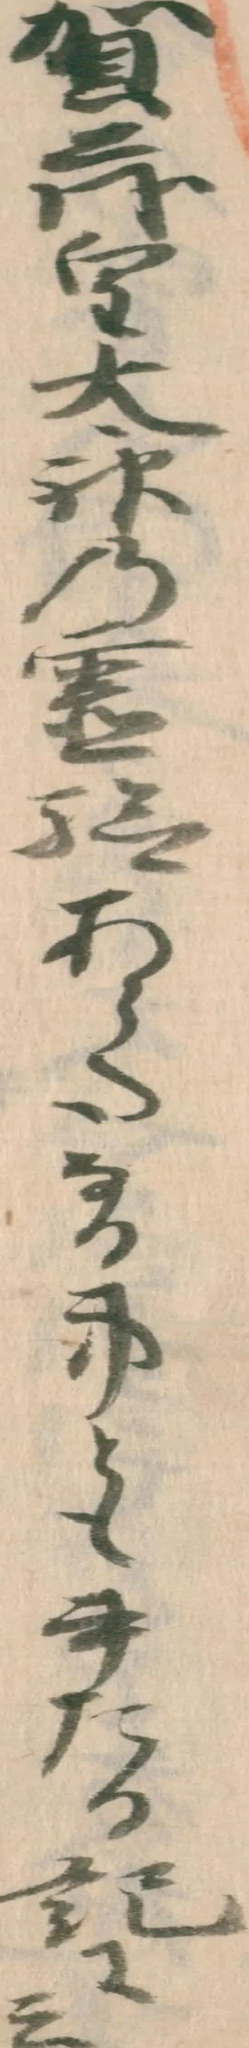賀茂皇太神の霊験あらたなる事とも書たる記に云
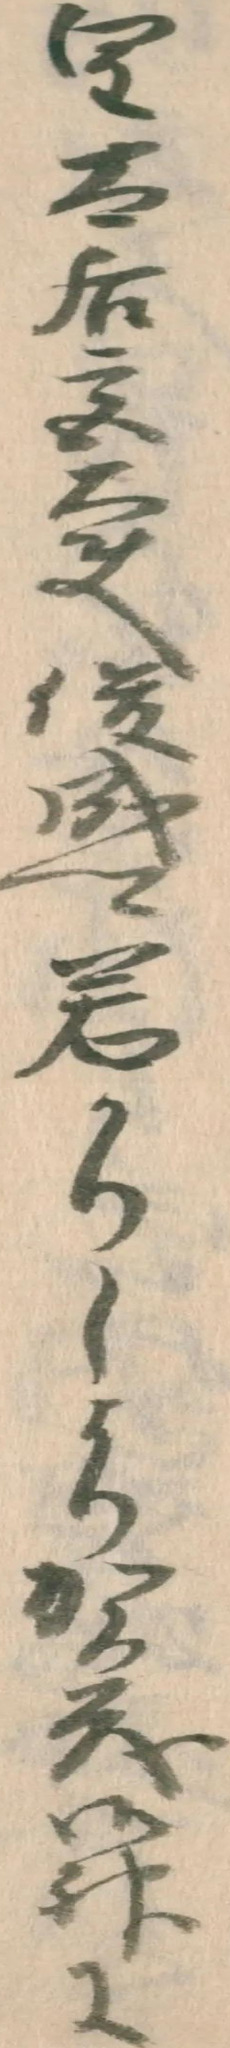皇太后宮大夫俊成卿若かりしより賀茂御神に
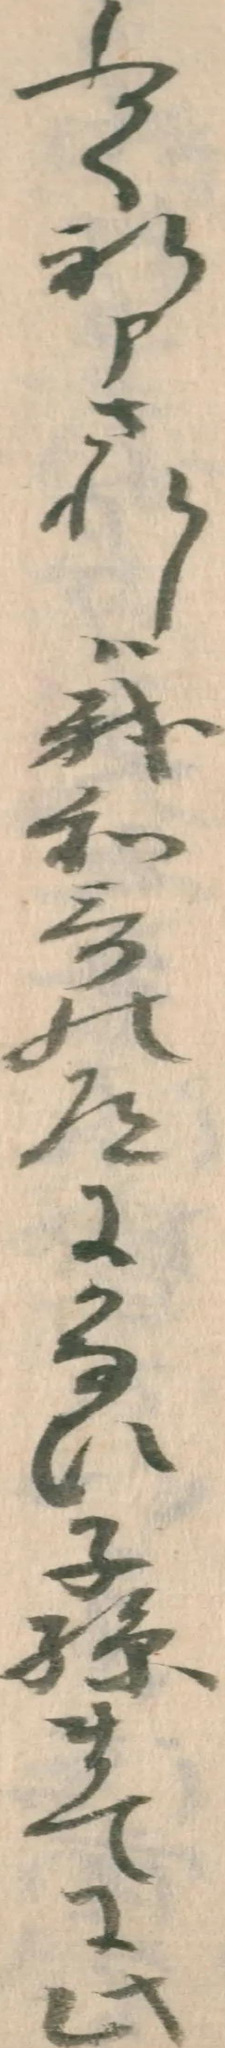ふかく祈申されしは我和哥の道にかなひ子孫まてに此
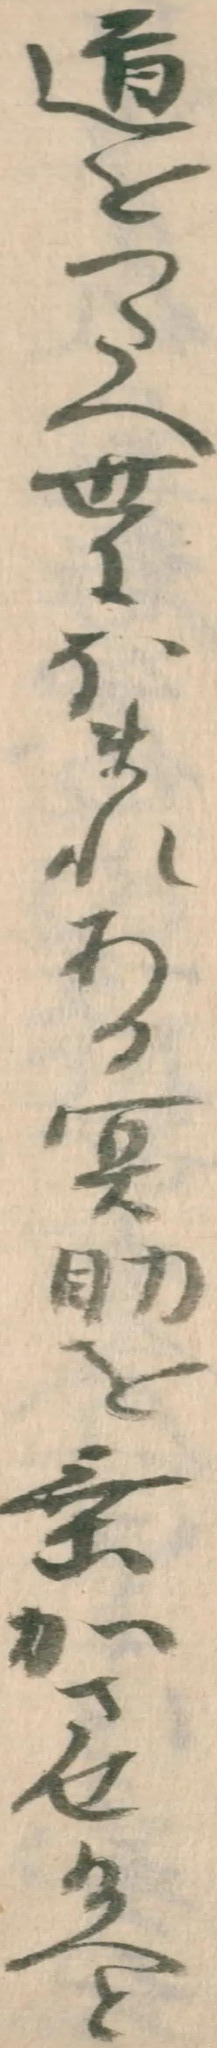道をつたへ世にほまれある冥助を垂かさせ給へと
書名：賀茂社記録. 第1冊
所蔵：国立国会図書館 National Diet Library, JAPAN
